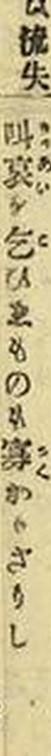叫哀を乞ひしものも寡かゞざりし
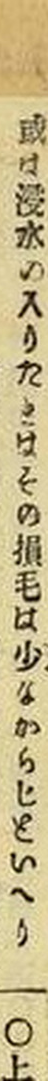或は浸水の入りたれはその損毛は少なからじといへり
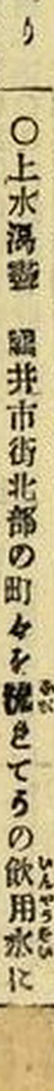○上水渇聲福井市街北部の町々を流れてかの飲用水に
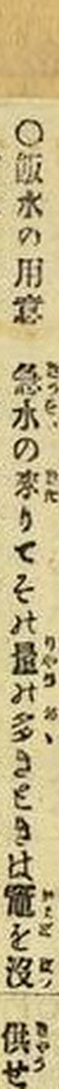○飯水の用意急水の來りてその量の多きときは竈を沒
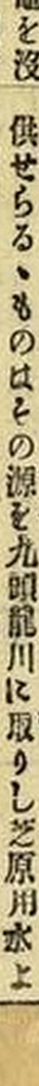供せらるゝものはその源を九頭龍川に取りし芝原用水よ
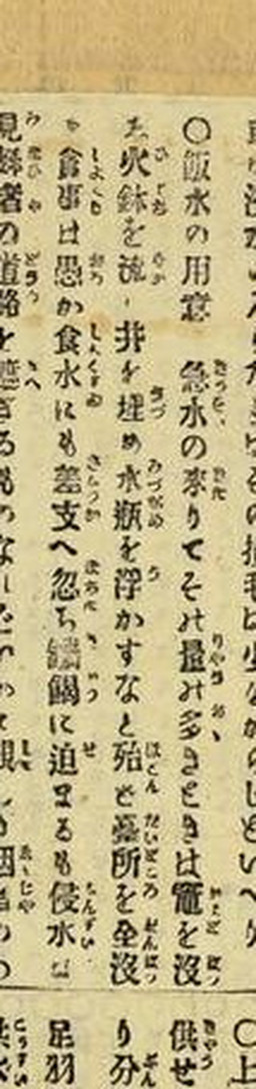し火鉢を流し井を埋め水瓶を浮かすなと殆ど臺所を全沒
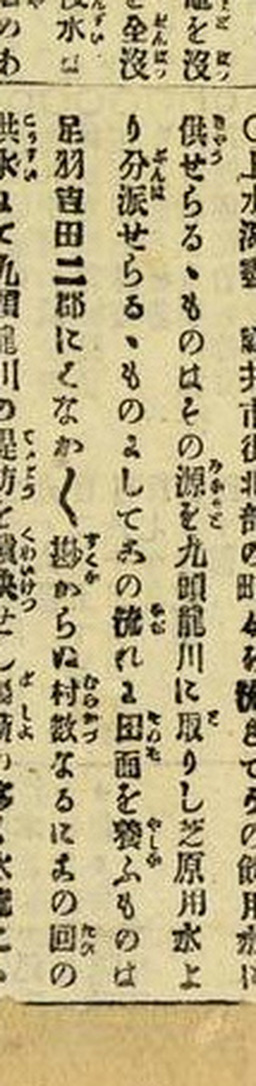り分派せらるゝものにしてこの流れに田面を養ふものは
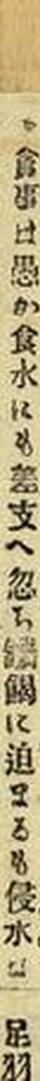し食事は愚か食水にも差支へ忽ち餓餲に迫まるも浸水は
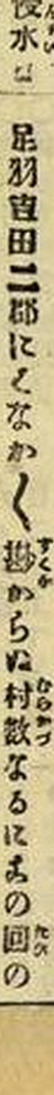足羽吉田二郎にはなか〳〵尠からぬ村數なるにこの回の
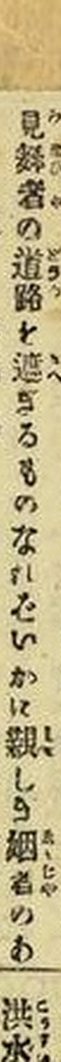見舞者の道路を遮ぎるものなればいかに親しき姻者のあ
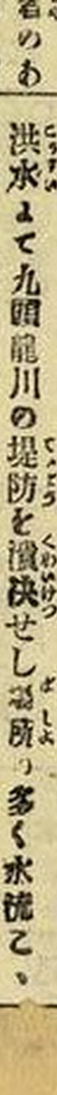洪水にて九頭龍川の堤防を潰決せし塲所の多く水流こゝ
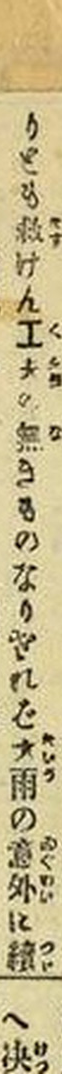りとも救けん工夫の無きものなりされば大雨の意外に續
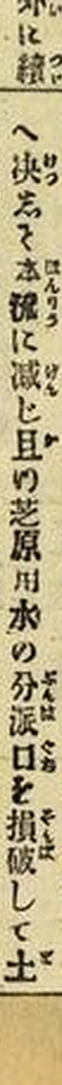へ決して本流に減じ且つ芝原用水の分派口を損破して土
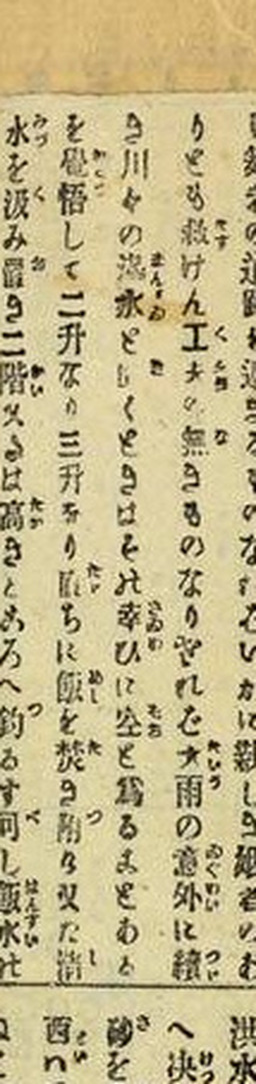き川々の滿水と聞くときはその幸ひに空と爲ることある
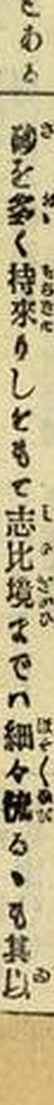砂を多く持來りしをもて志比境までは細々流るゝも其以
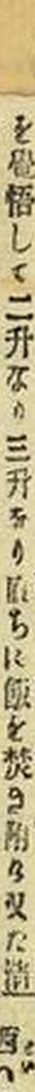を覺悟して二升なり三升なり直ちに飯を焚き附け又た清
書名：温古集 五巻
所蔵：福井県文書館 Fukui Prefectural Archives
